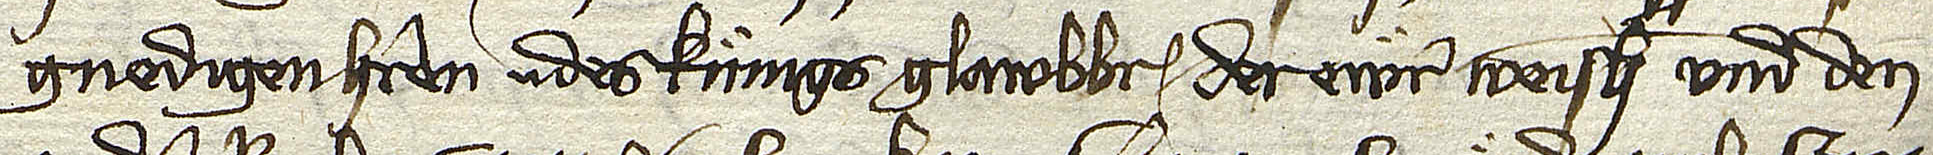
gnedigen h*ren ~ des künigs glawbbr* / der ew*r weiſh* vnd den
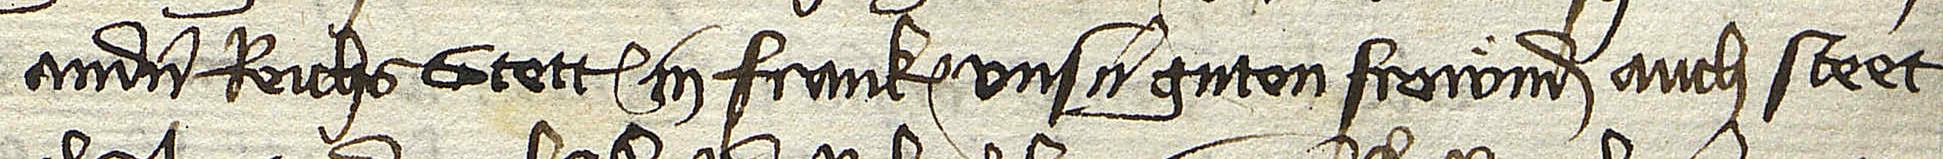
and*n Reichs Stett* in frank* vnſ*n guten frewnd* auch ſteet
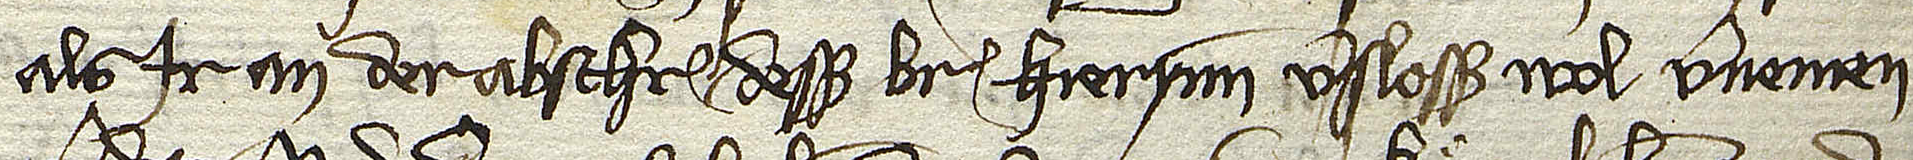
als Ir an der abſchr* / deſſ* br* hierynn* vſloſſ* wol v*nemen
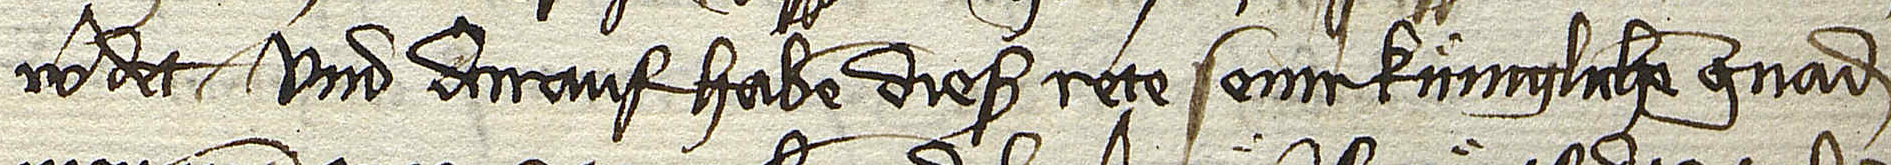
w*det / Vnd darauf habe* dieſ* rete ſeinr künigliche* gnad*
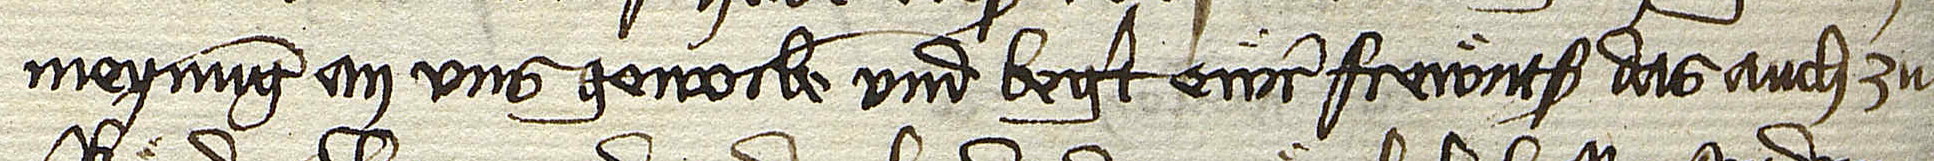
meynu*g an vns geworbe* vnd beg*t ew*r frewntſ* das auch ʒu
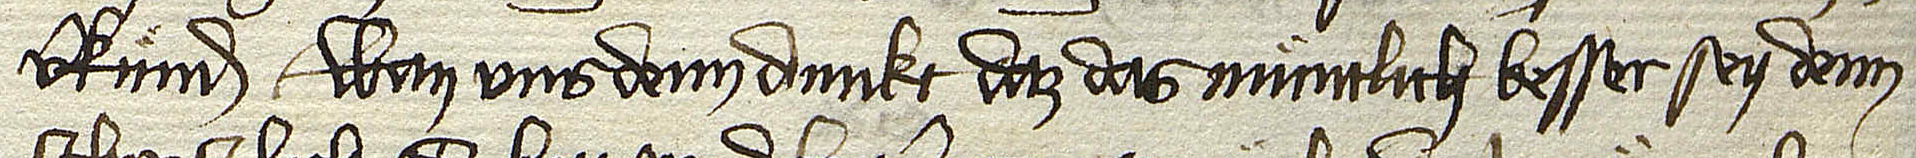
v*künd* / Wan vns denn dunkt daʒ das müntlich beſſer ſey denn
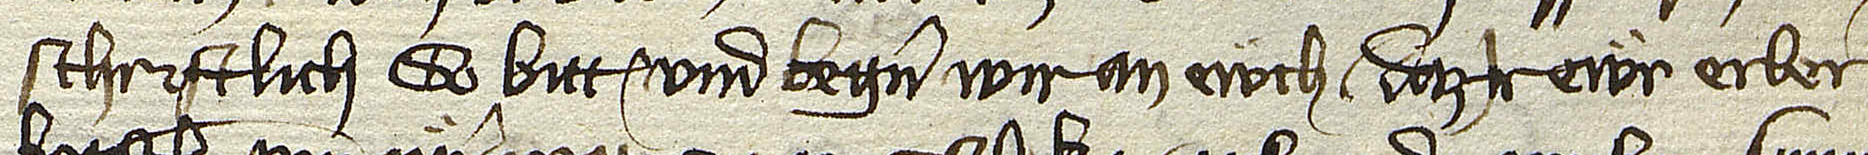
ſchriftlich So bitt* vnd beg*n wir an ewch / daʒ Ir ewr erber
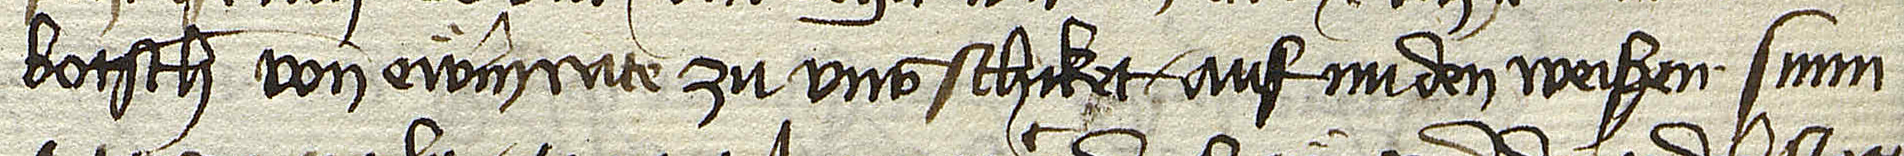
botſch* von ew*m rate ʒu vns ſchiket / auf nu den weiſʒen . ſunn =
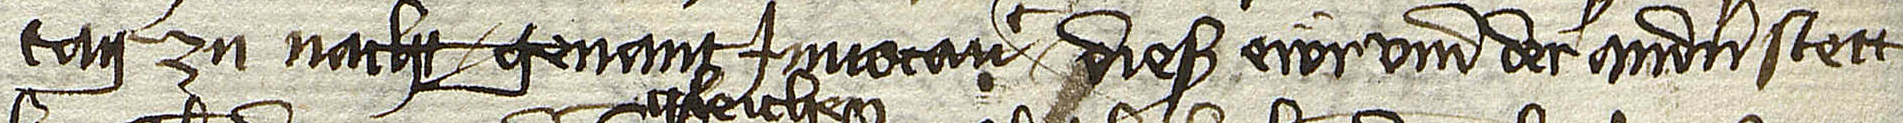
tag ʒu nacht / genant Inuocau* / dieſ* ewr vnd der and*n ſtett
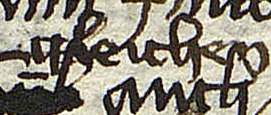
gleichen
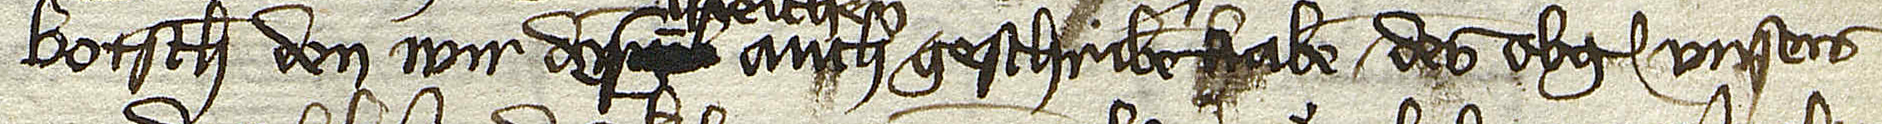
botſch* den wir deſgel auch geſchribe* habe* / des obg* vnſers
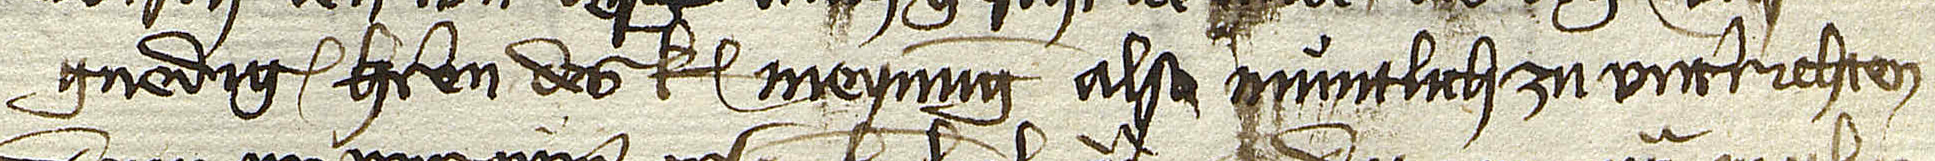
gnedig* h*ren des k* meynug* alſo müntlich ʒu vnt*richten
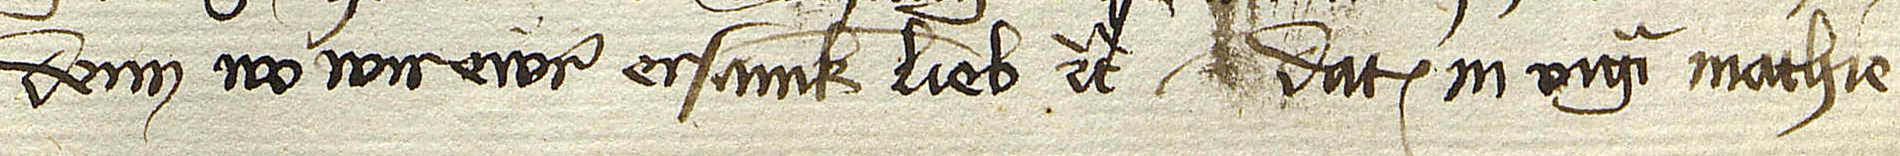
Denn wo wir ew*r erſamk* lieb ec* / Dat* in vigi* mathie
